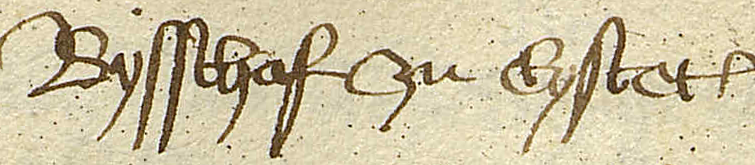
Byſſchof cʒu Eyſtet*
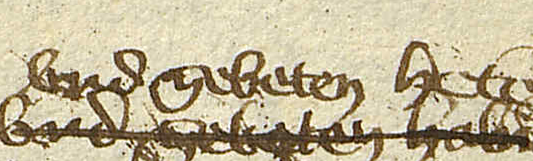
vnd gebeten hete*
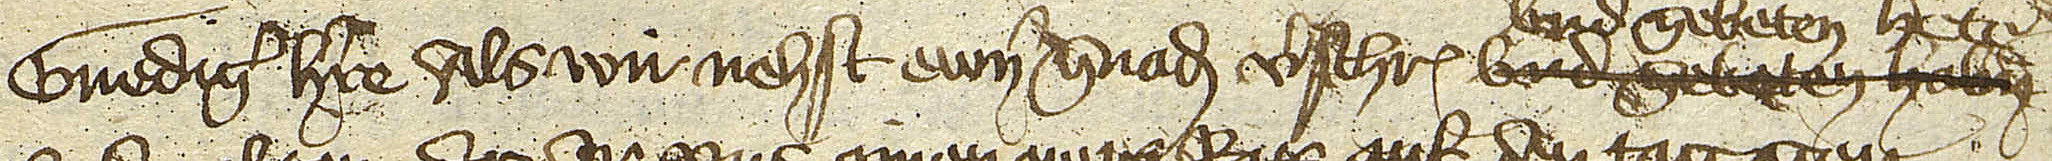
Gnedig* h*re Als wir nehſt ewn* gnad v*ſchr* vnd gebeten habn*
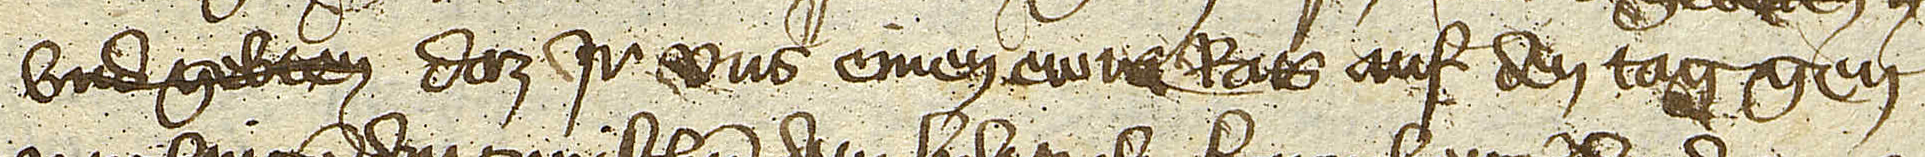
vnd gebten daʒ Ir vns einen ewrs Rats auf den tag gen
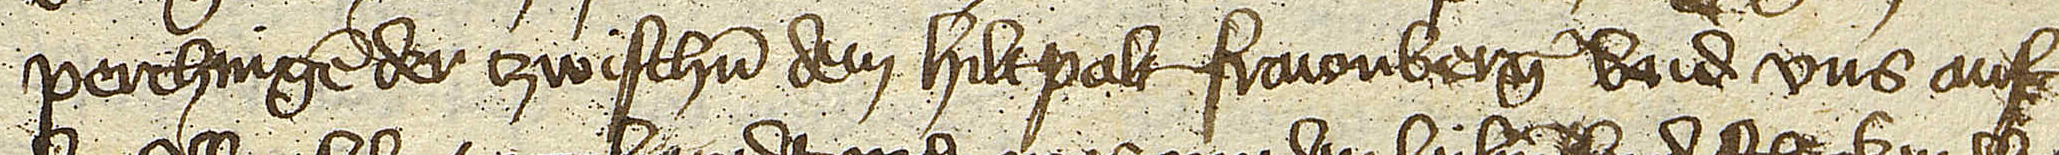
Perchinge* der cʒwiſchn* den hiltpolt frawnberg* vnd vns auf
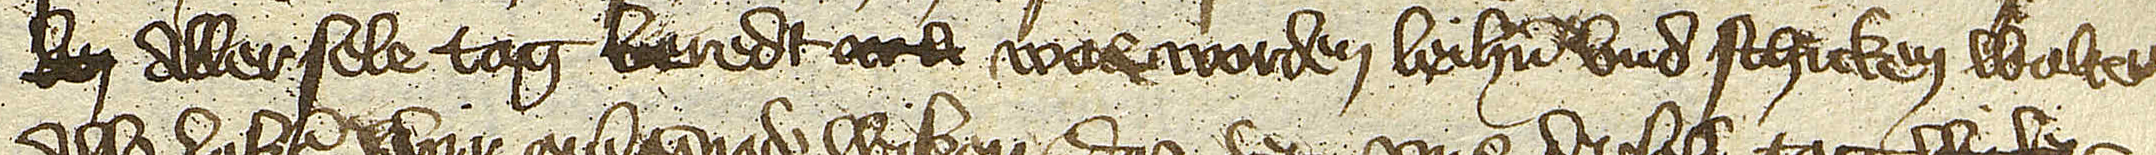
den Allerſele tag beredt w% was worden leihn* vnd ſchicken woltett
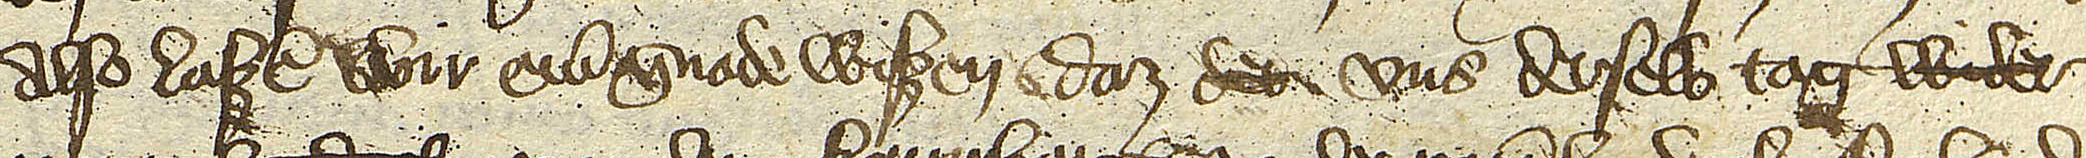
Alſo laſʒe* wir ew* gnade wiſʒen / daʒ der vns derſelb tag wider
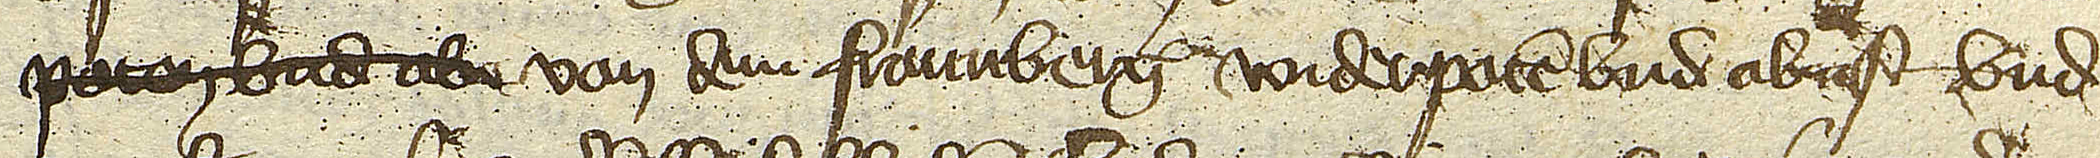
poten vnd ab von dem fraunberg* widerpote* vnd ab iſt vnd
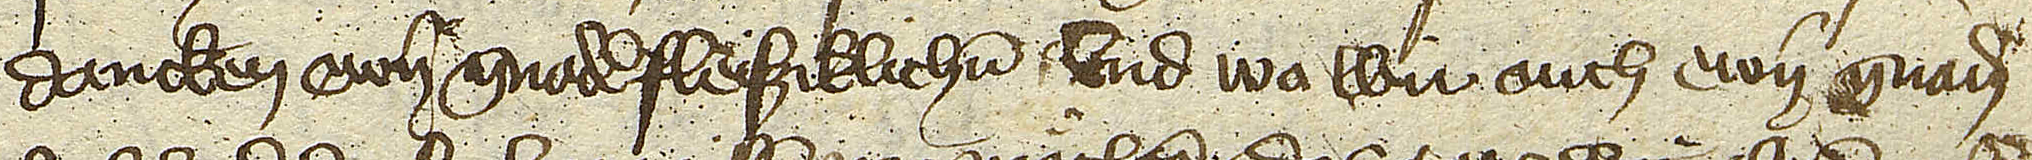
dancken ewn* gnade* fleiſʒiklichn* / vnd wo wir auch ewn* gnad
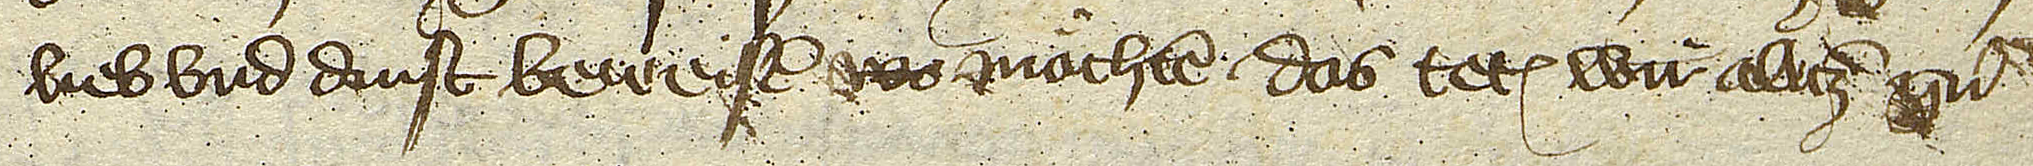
lieb vnd dinſt beweiſe* wo möchte* / das tet* wir allcʒ* gn*
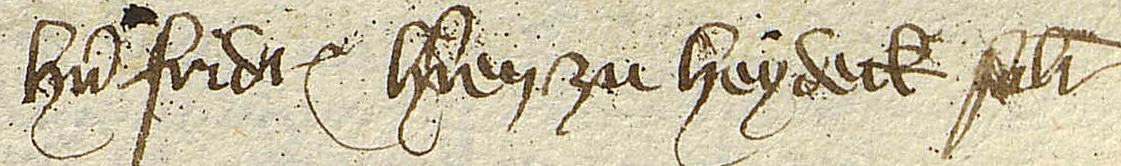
hn* fridr* hr*en cʒu heydeck ſilr*
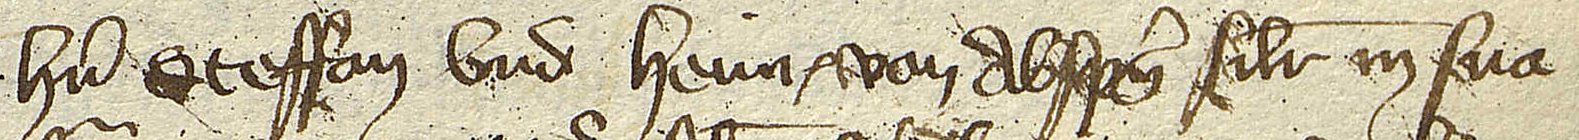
hn* Steffan vnd heinr* von Abſp*g ſilr* in ſua
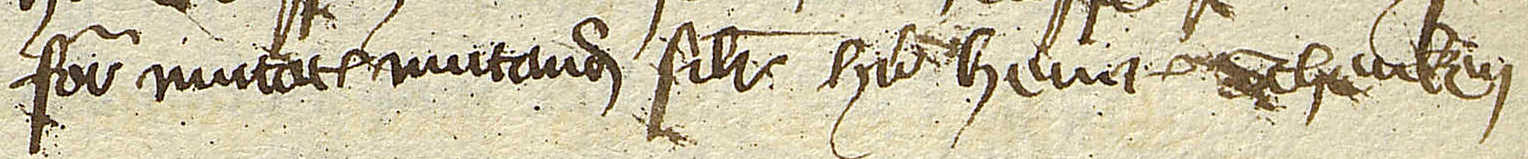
for* mutat* mutand* ſilr* hn* heinr* Schenken
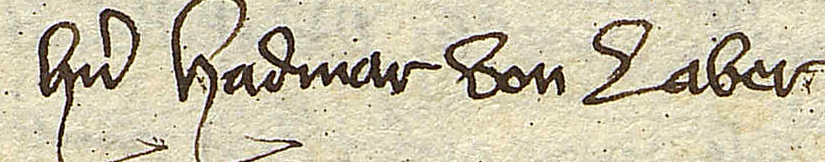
hn* Hadmar von Laber
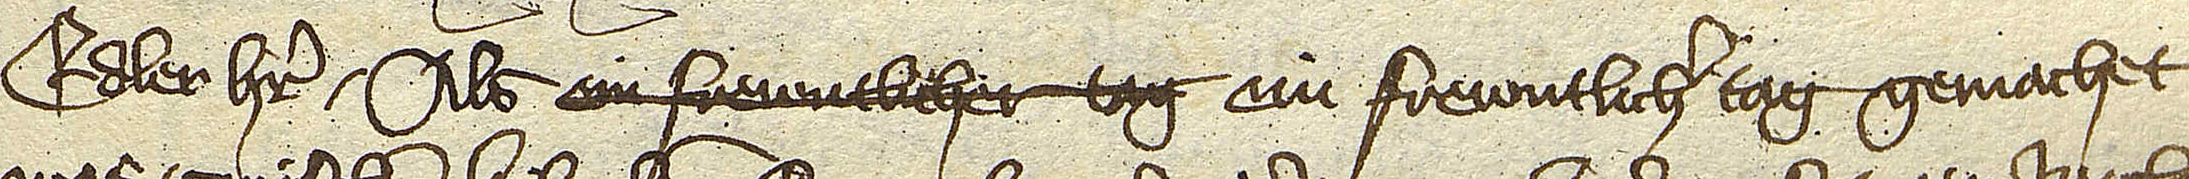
Edler hr* / Als ein frewntlicher tag ein frewntlich* tag gemachet
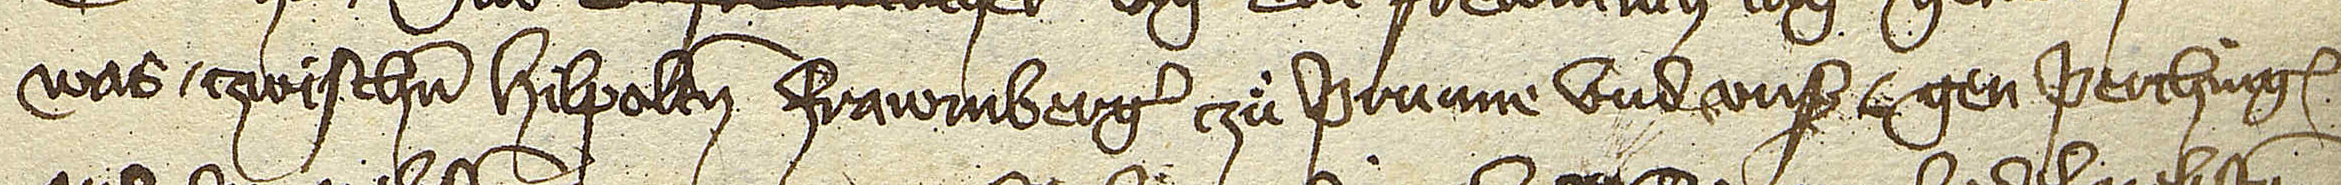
was / cʒwiſchn* Hilpoltn* Frawmberg* cʒü Prunne vnd vnſ* / gen Perching*
